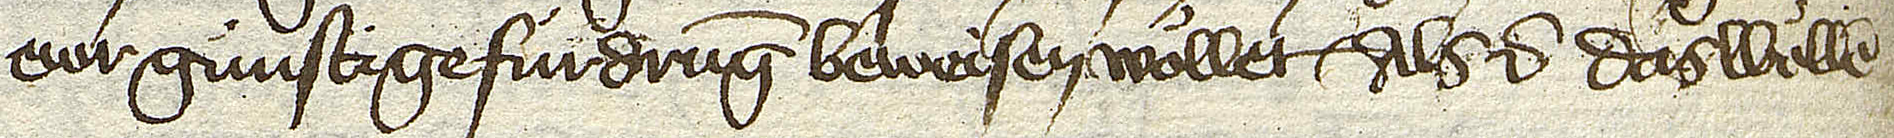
ewr günſtige fürdru*g beweiſen wöllet / Als ec* das wölle*
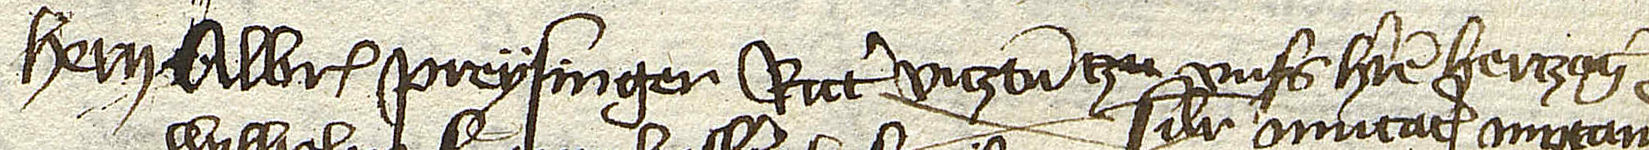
Hern Albr* preyſinger Ritt* vicʒtu* cʒu vnſ*s h*re hercʒog*
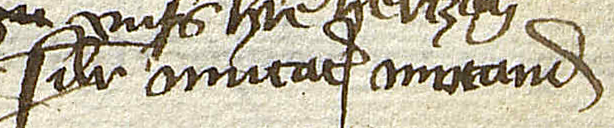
ſilr* mutat* mutand*
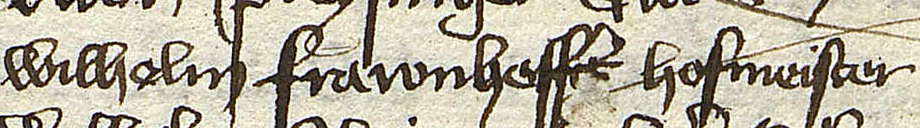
Wilhelm Frawnhoff* hofmeiſter
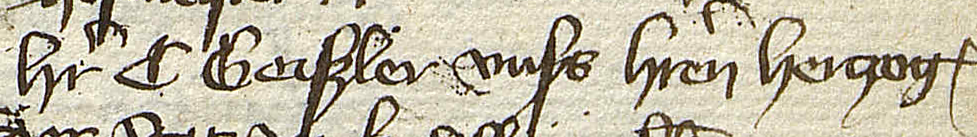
Hr* C Geiſʒler vnſ*s hren* hercʒog*
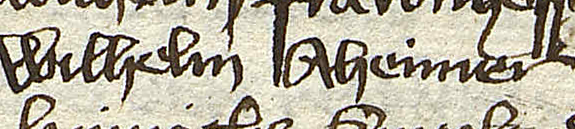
wilhelm Aheimer
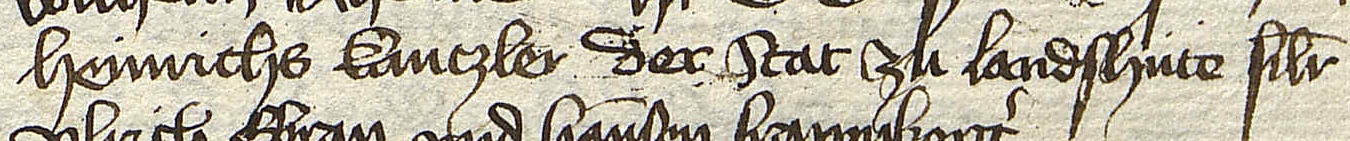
heinrichs kancʒler der Stat cʒu landſhute ſilr*
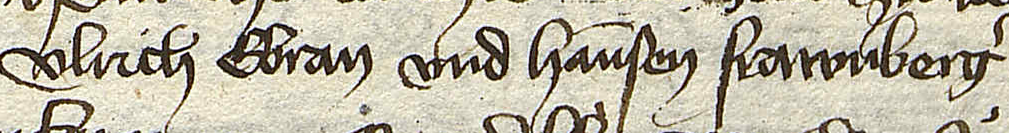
vlrich Ebran vnd Hanſen frawnberg*
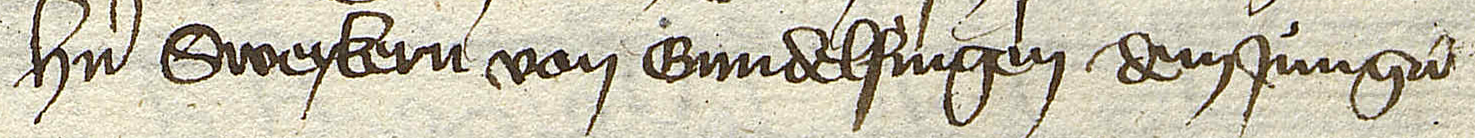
H*n Sweykern von Gundelfingen / dem Iüng*n
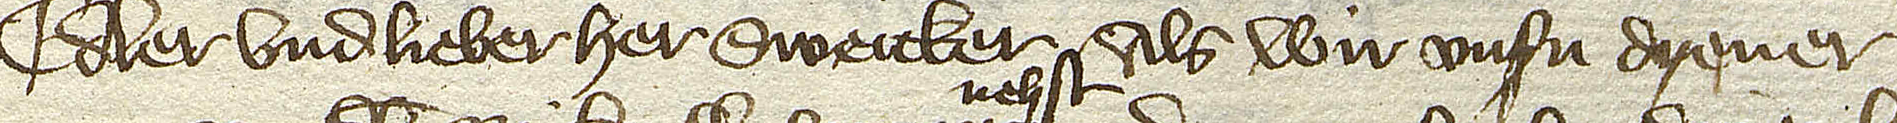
Edler vnd lieber her Sweicker / Als wir vnſ*n dyener
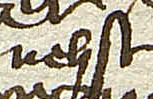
nehſt
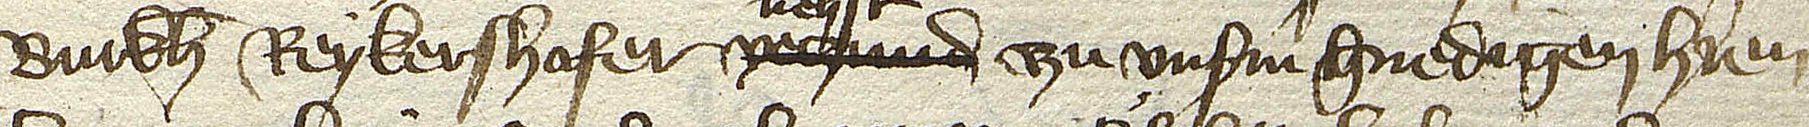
Burkh* Reykerſhofer yecʒund* cʒu vnſ*m gnedigen h*ren
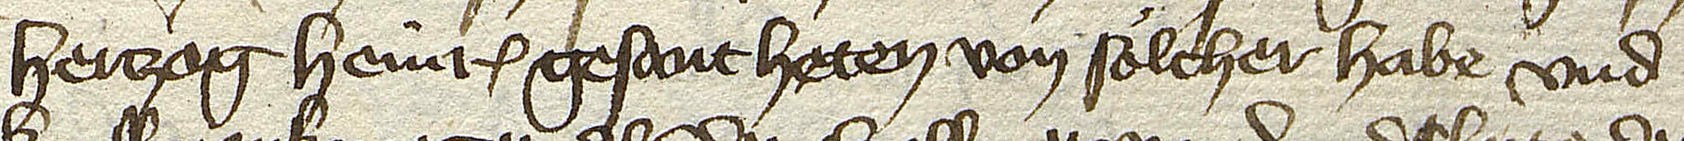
hercʒog heinr* geſant heten von ſölcher habe vnd
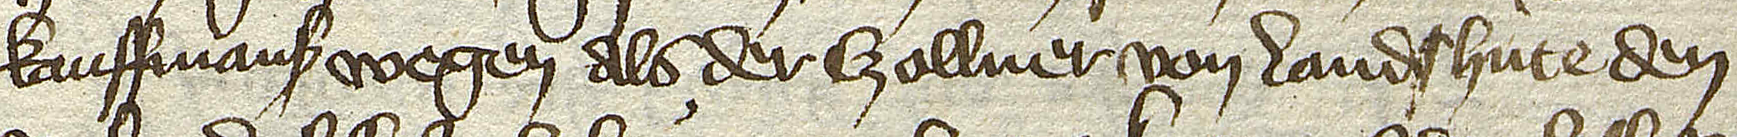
kauffmanſ* wegen Als der Cʒollner von landſhute den
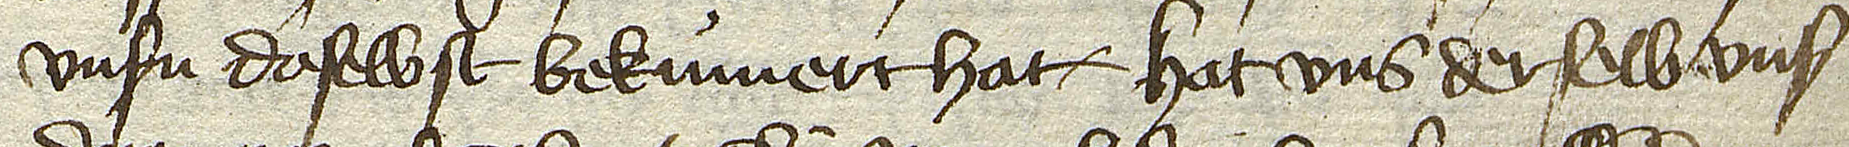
vnſ*n daſelbſt bekümert hat / Hat vns derſelb vnſ*
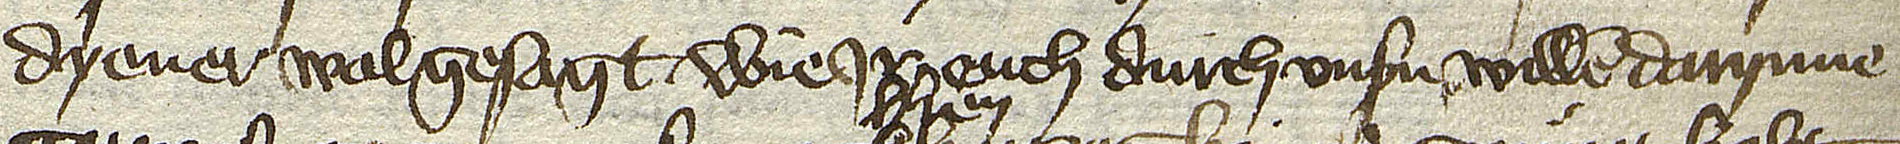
dyener wol geſagt / wie Ir euch durch vnſ*n wille* darynne
